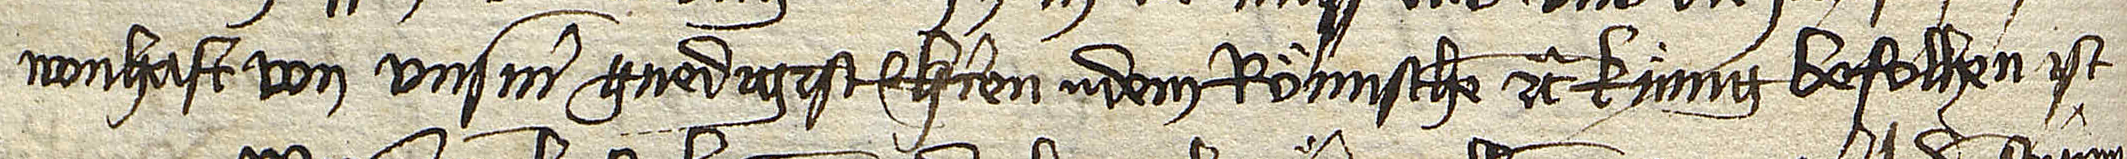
wonhaft von vnſm* gnedigiſt* h*ren ~ dem Römiſche* ec* künig befolhen iſt
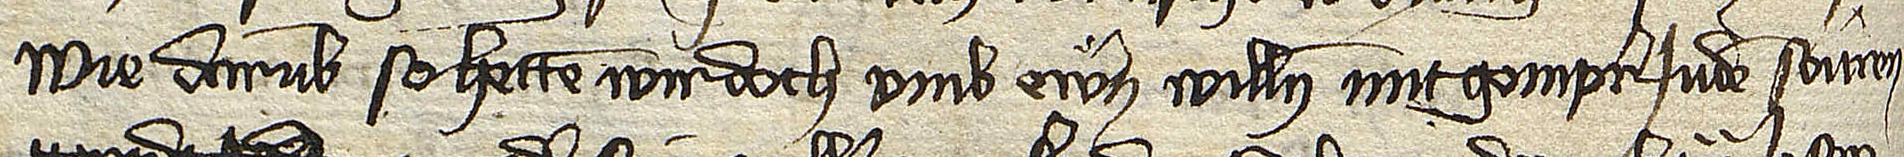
Wie darub* ſo hette* wir doch vmb eẅ*n willn* mit gompr* Iude* ſou*ren
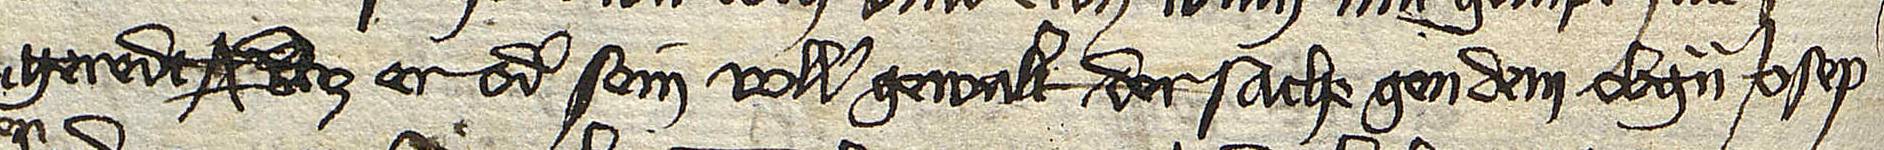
geredt Daʒ er od* ſein voll* gewalt / der ſache gen dem obgn* Ioſep
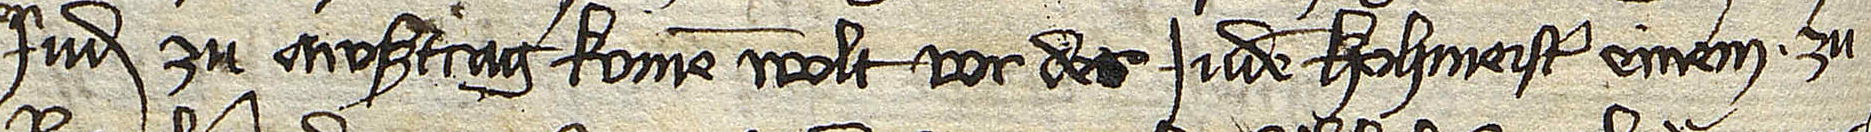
Iud* ʒu awſʒtrag kome* wolt vor des Iude* Hohmeiſt* einem . ʒu
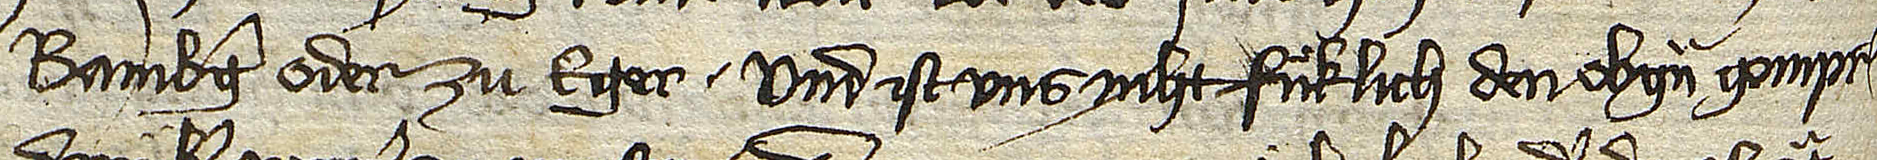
Bamb*g oder ʒu Eger / Vnd iſt vns niht füklich den obgn* gompr*
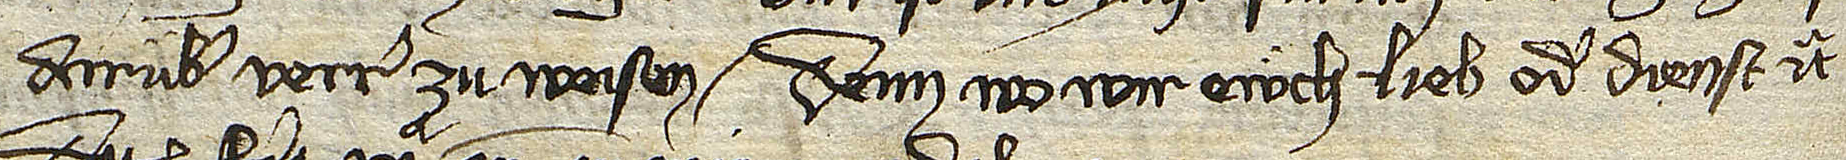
darüb* verr* ʒu weiſen / Denn wo wir eẅch lieb od* dienſt ec*
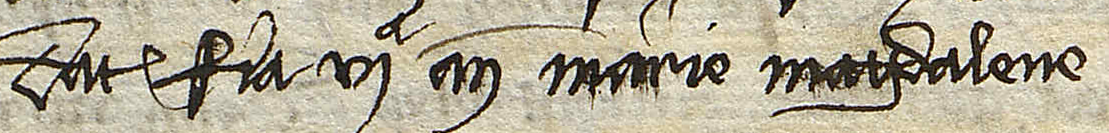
Dat* fi*a vi* an* marie magdalene
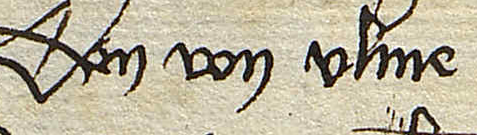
Den von vlme
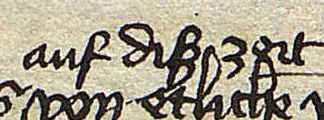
auf diſʒ ʒeit
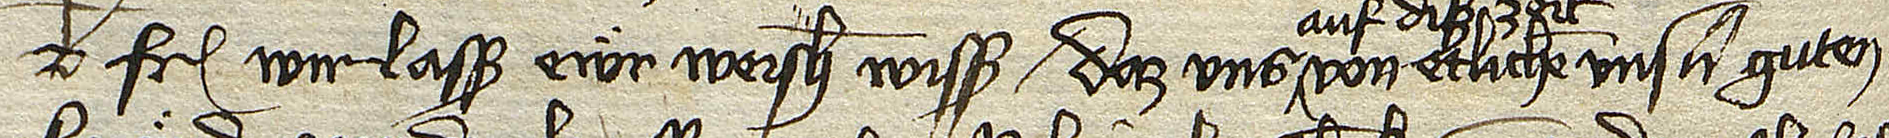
L* fr* wir laſſ* eẅr weiſh* wiſſ* / Daʒ vns von etliche* vnſn* guten
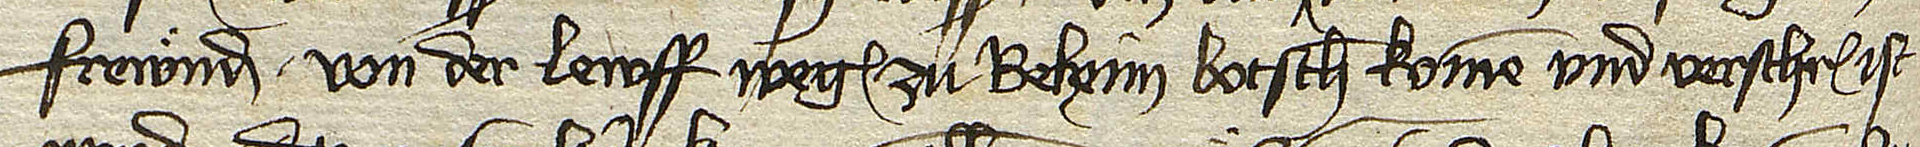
freẅnd* / von der lewff weg* ʒu Beheim botſch* kome* vnd verſchr* iſt
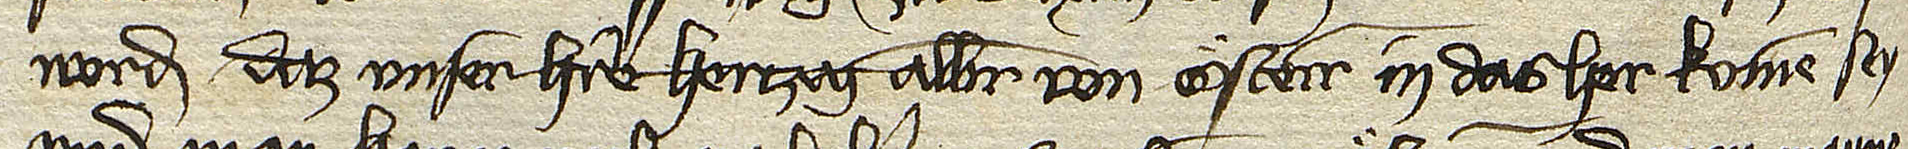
word* / daʒ vnſer h*re hercʒog albr* von Öſterr* in das her kome* ſey
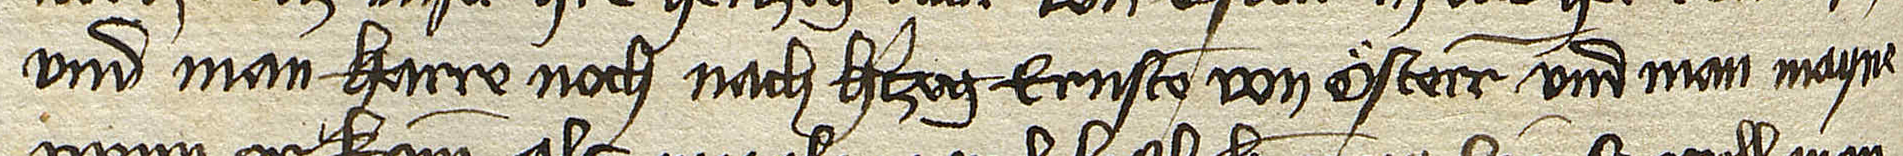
vnd man harre noch nach h*cʒog Ernſte* von Öſterr* vnd man mayne
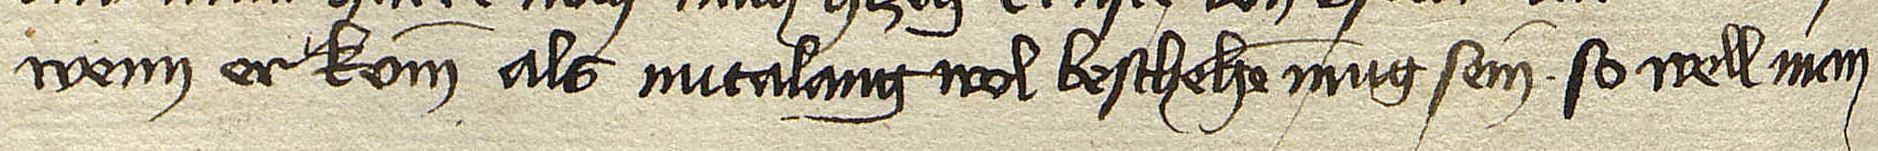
wenn er kom* als %%talang wol beſchehe* mug ſein . ſo well man
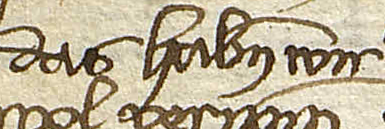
das habn* wir
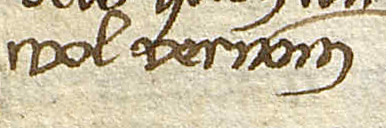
wol vernom*
